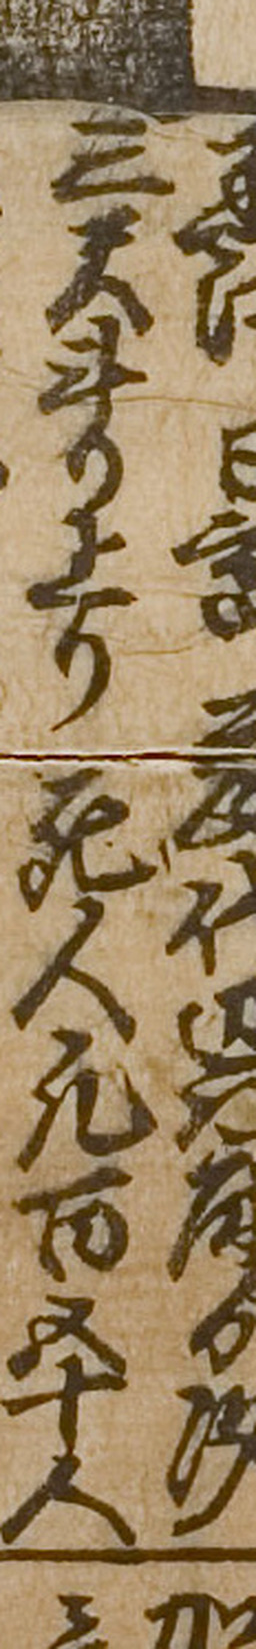三尺斗り上り死人凡百五十人
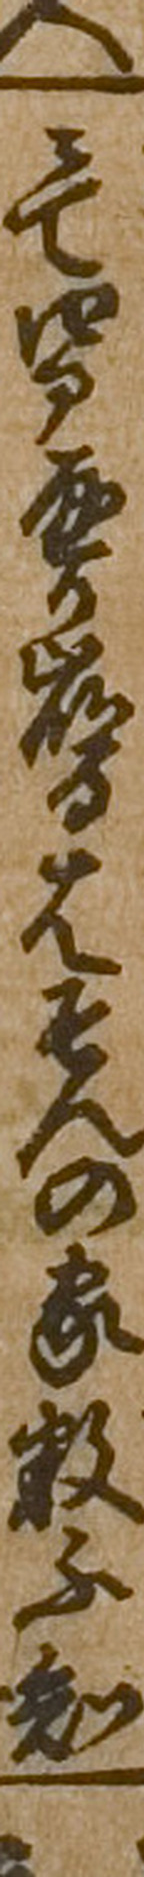二て四部辺り崩るはそんの家数不知
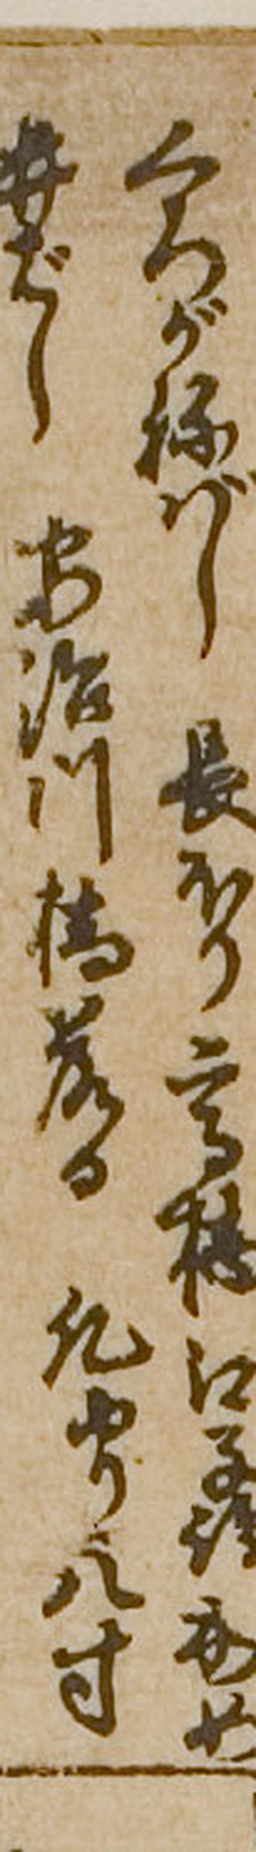井ばし安治川橋落る凡ゆり八寸
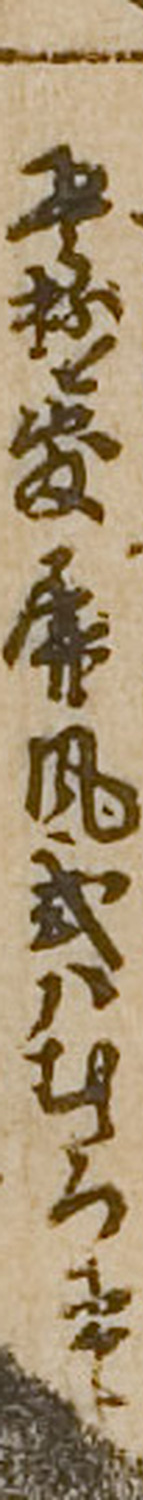畳抔を敷屏風或ハむしろにて
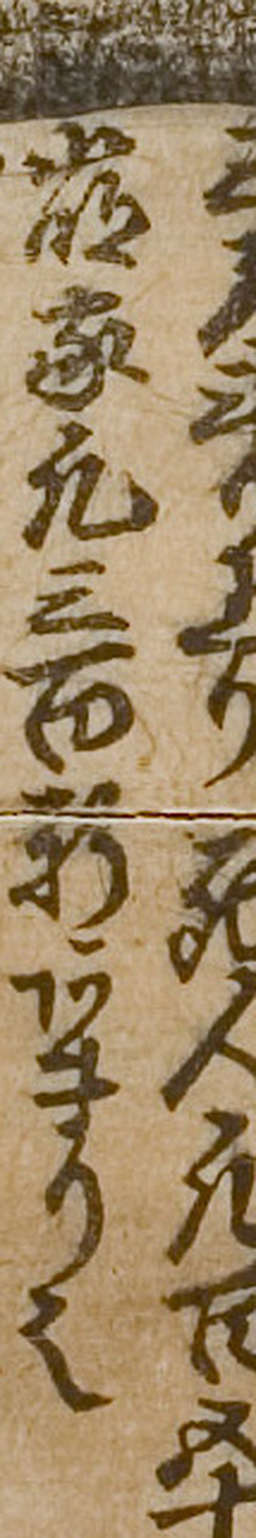崩家凡三百軒あまり也
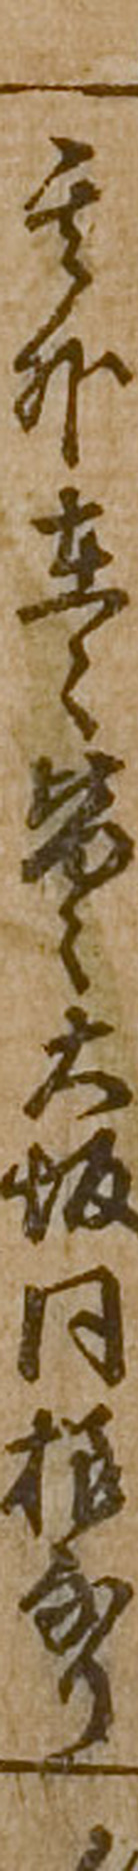其外在々皆々大坂同様なり
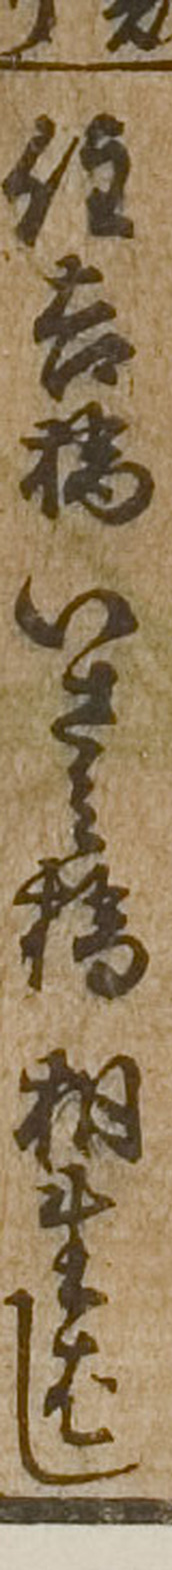住吉橋いさミ橋相生はし
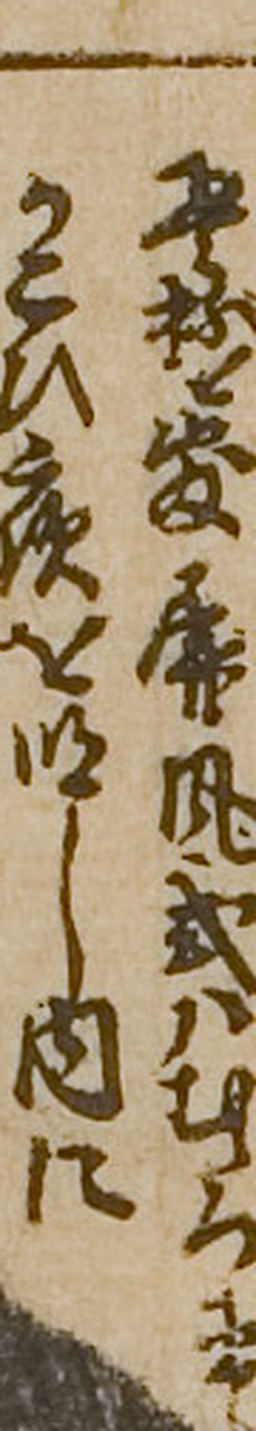かこひ夜を明し内に
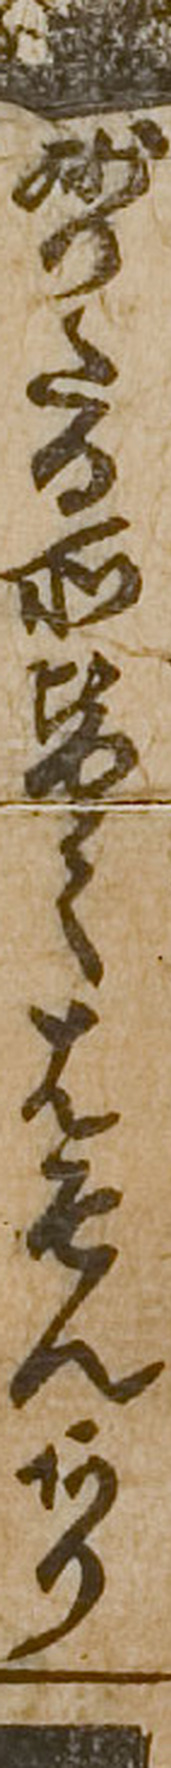残りたる所皆々はそんあり
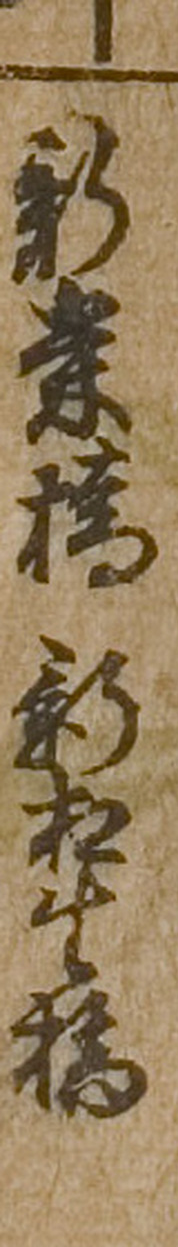新栄橋新相生橋
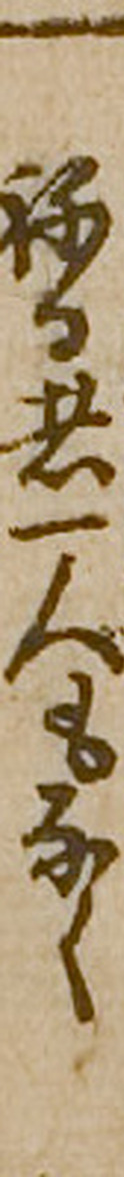ねる者一人もなく
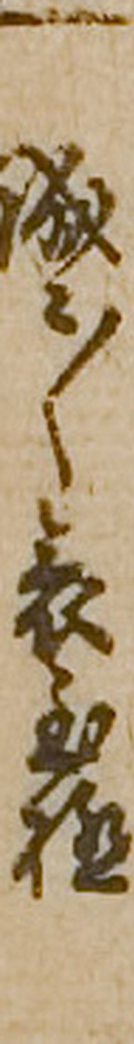誠ニ〳〵哀至極
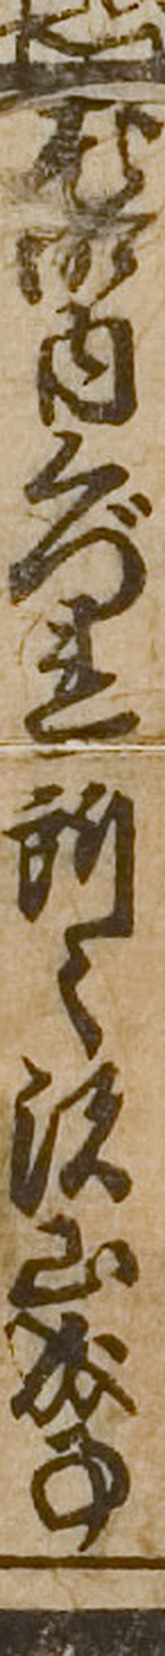尤御内くづれ所々沢山成事
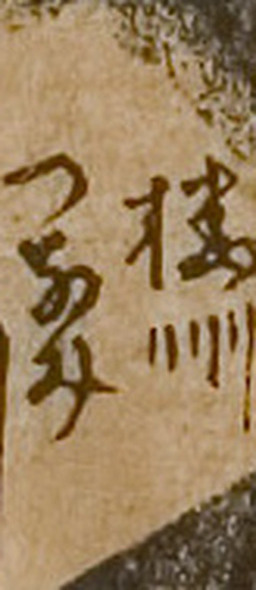つなみ
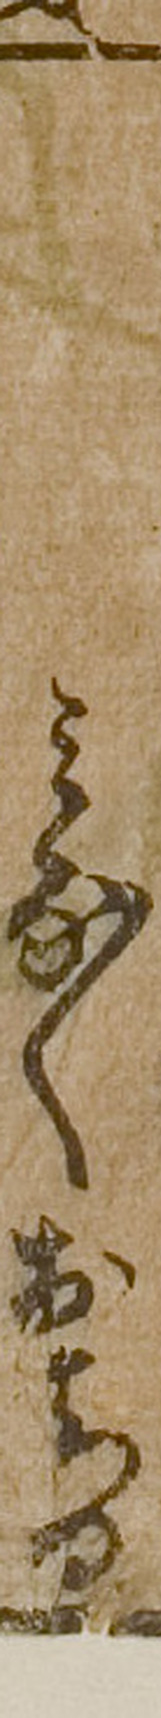ミな〳〵おちる
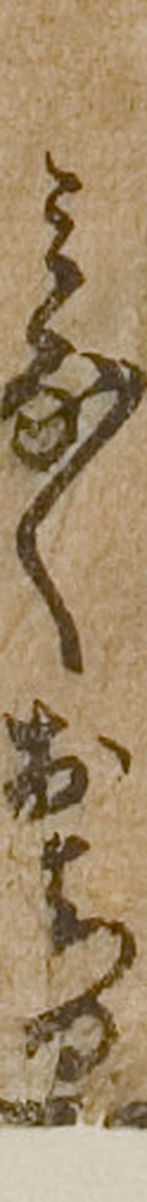ミな〳〵おちる
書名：[大坂つなみ]
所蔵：東京大学総合図書館 General Library in the University of Tokyo, JAPAN
